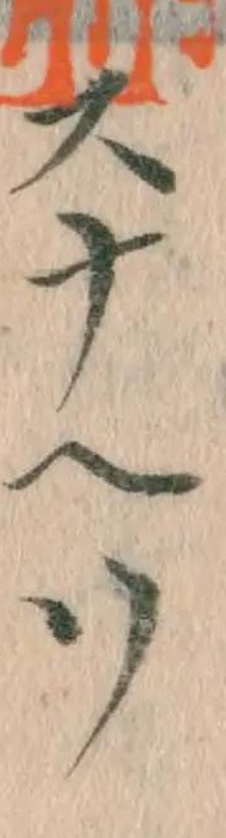スナヘソ
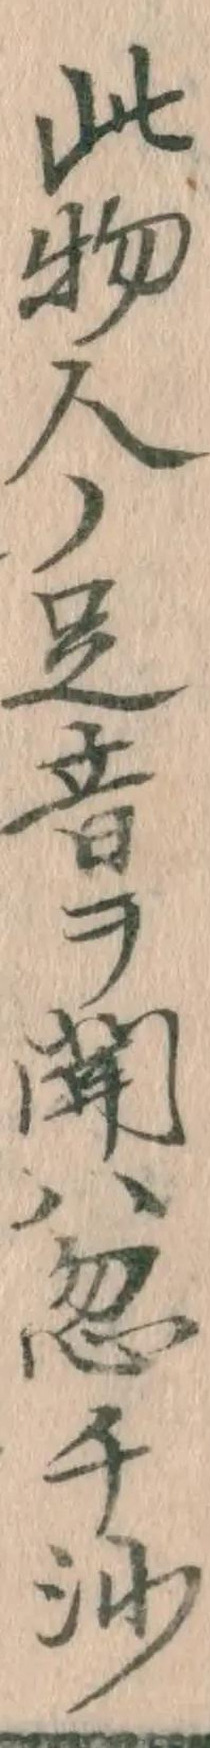此物人ノ足音ヲ聞ハ忽チ沙
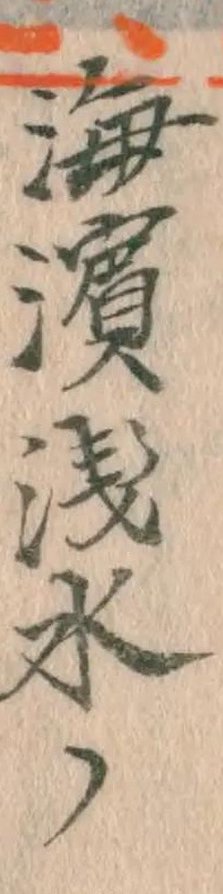海浜浅水ノ
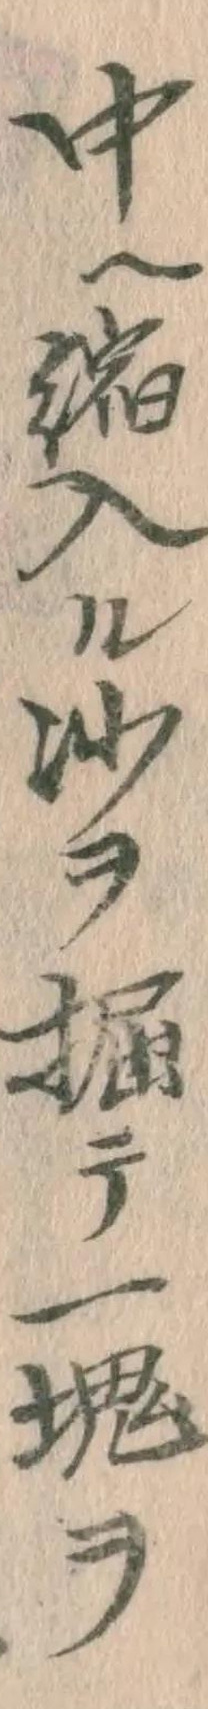中へ縮入ル沙ヲ掘テ一塊ヲ
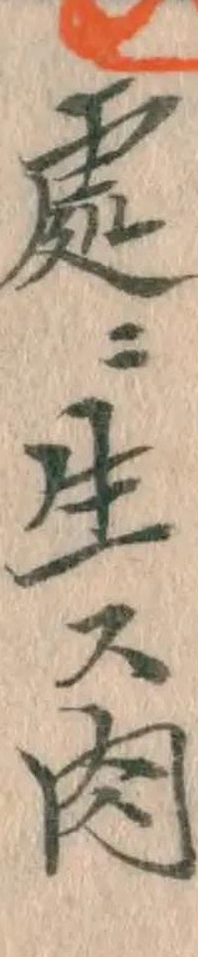處ニ生ス肉
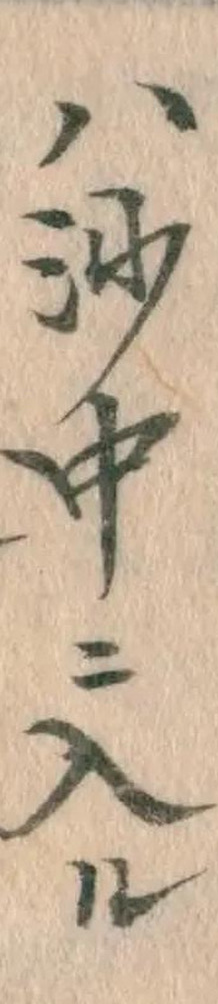ハ沙中ニ入ル
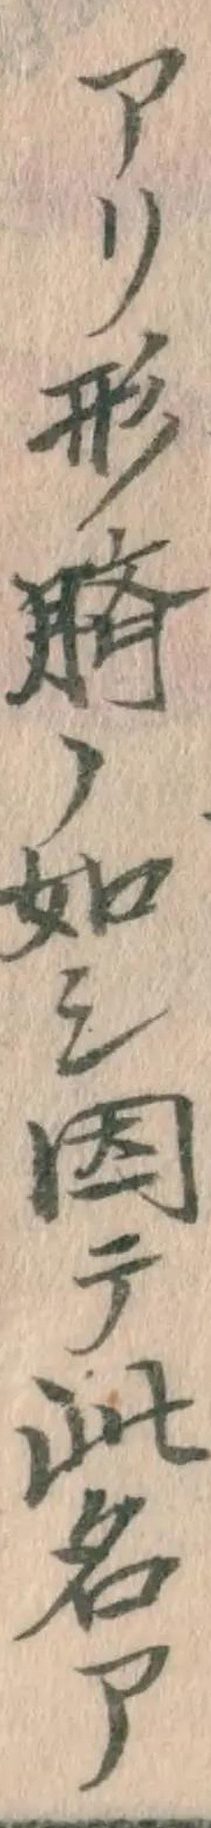アリ形臍ノ如シ因テ此名ア
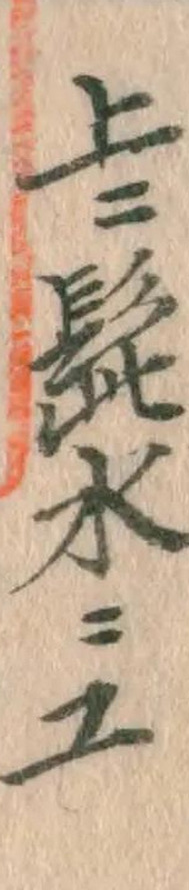上ニ髭水ニユ
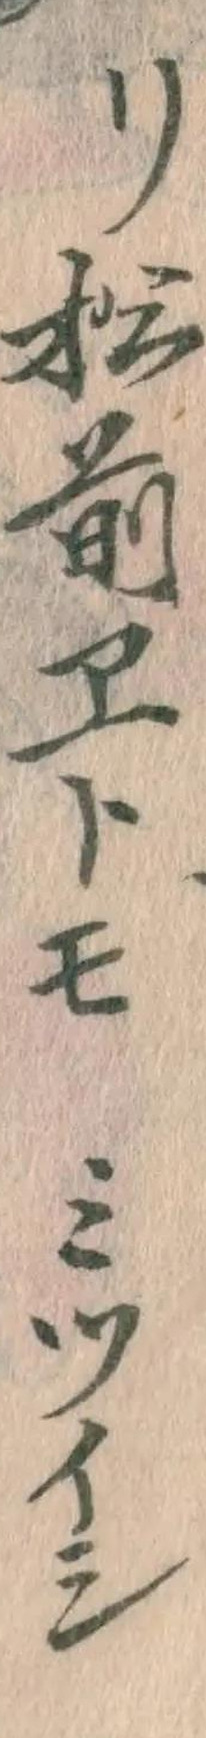リ松前ヱトモミツイシ
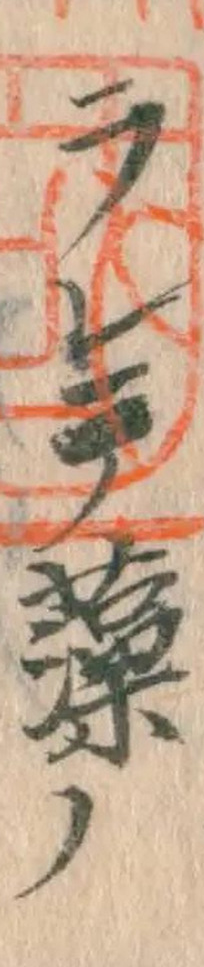ラシテ藻ノ
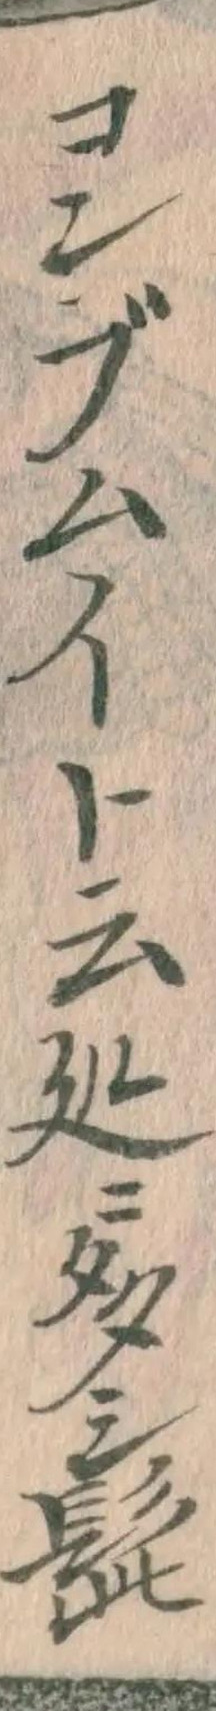コンブムイト云処ニ多シ髭
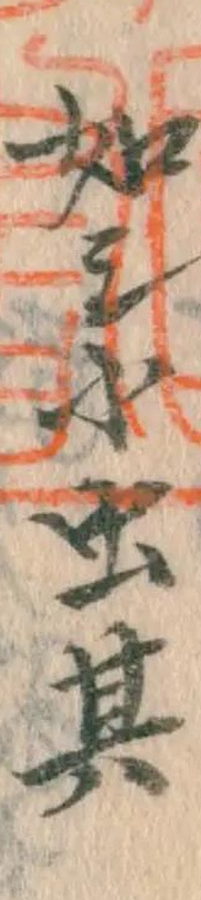如シ小虫其
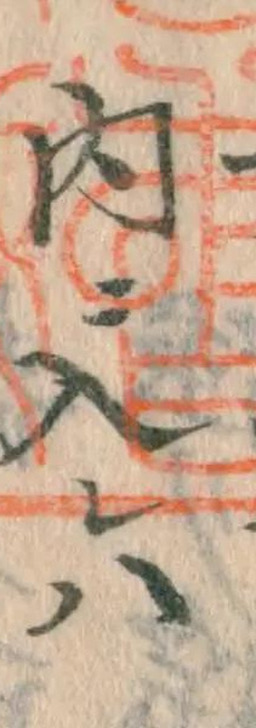内ニ入レハ
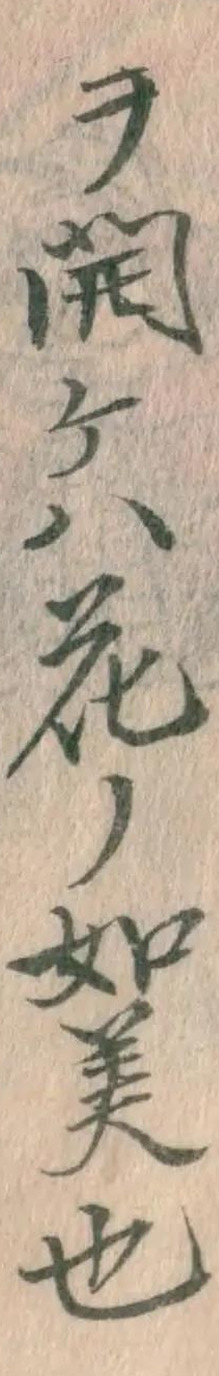ヲ開ケハ花ノ如美也
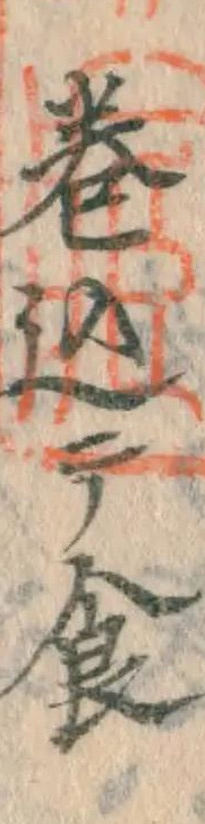巻込テ食
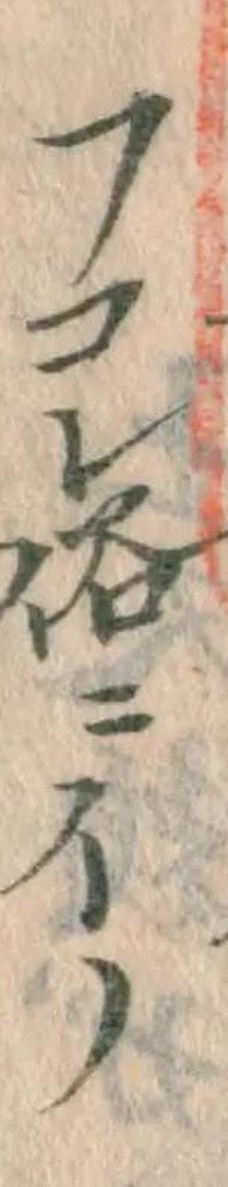フコレ俗ニイノ
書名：千蟲譜 3巻. [3]
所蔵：国立国会図書館 National Diet Library, JAPAN
